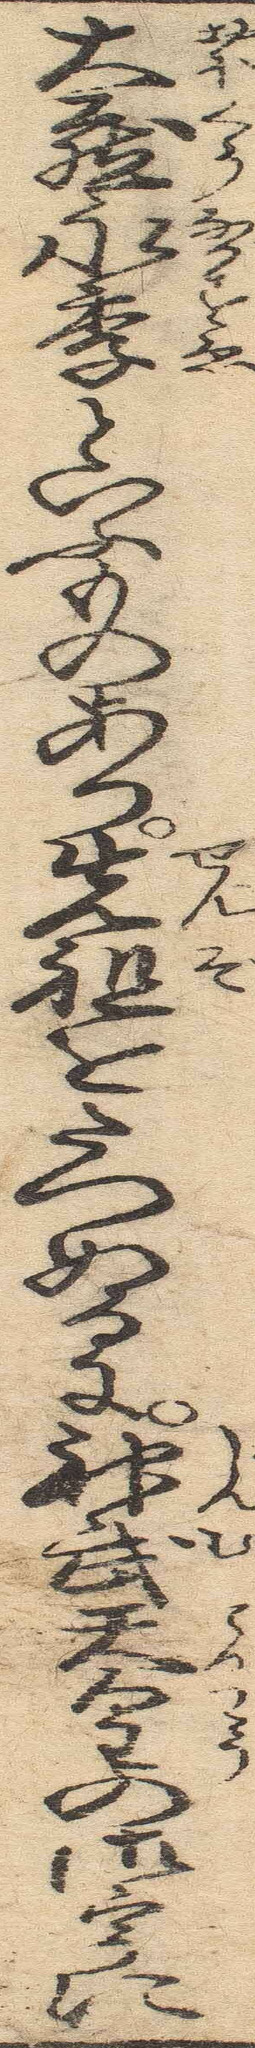大蔵永季といふものあり。先祖をきはめるに。神武天皇の御宇に
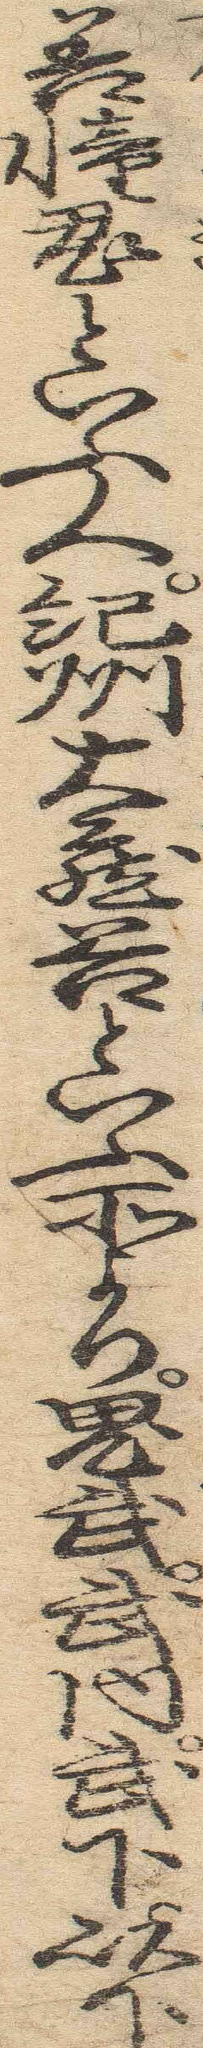善憧鬼といふ人紀州大蔵谷といふ所より鬼武。武内。武下。以下
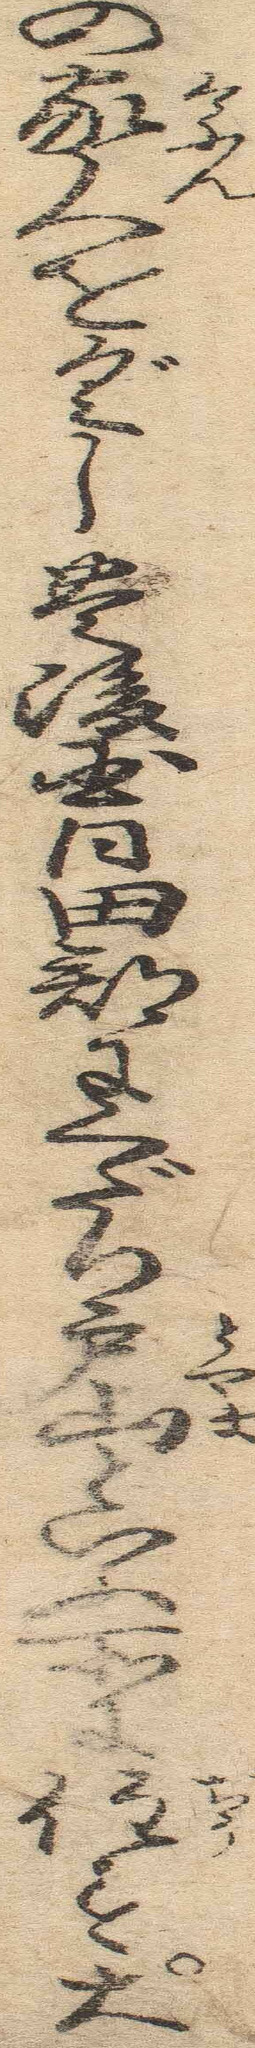の家人をぐし豊後国日田郡にくだり戸山といふ所に住す。大
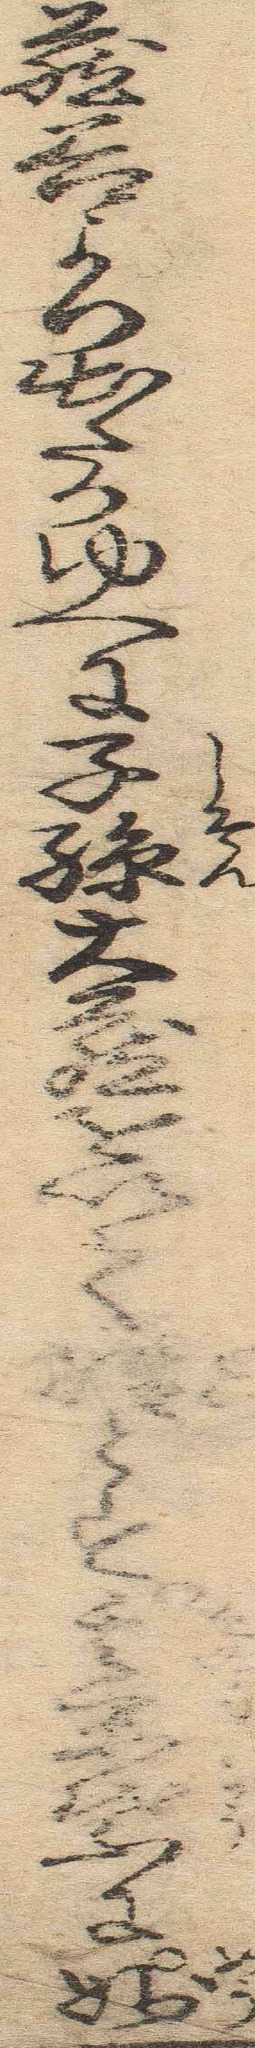蔵谷より出たるゆへに子孫大蔵を以て姓とす。其未葉に妙

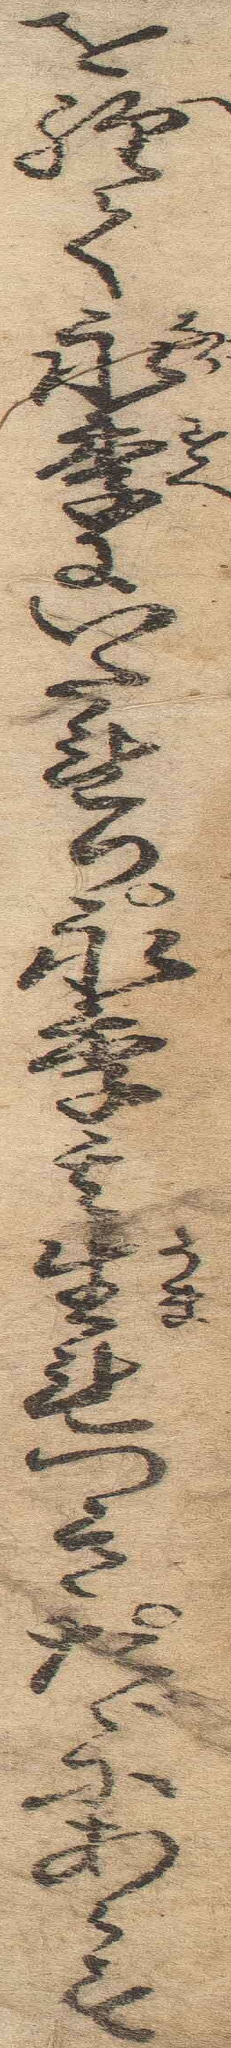を経て永季にいたれり。永季其生れつき。たゞにあらす
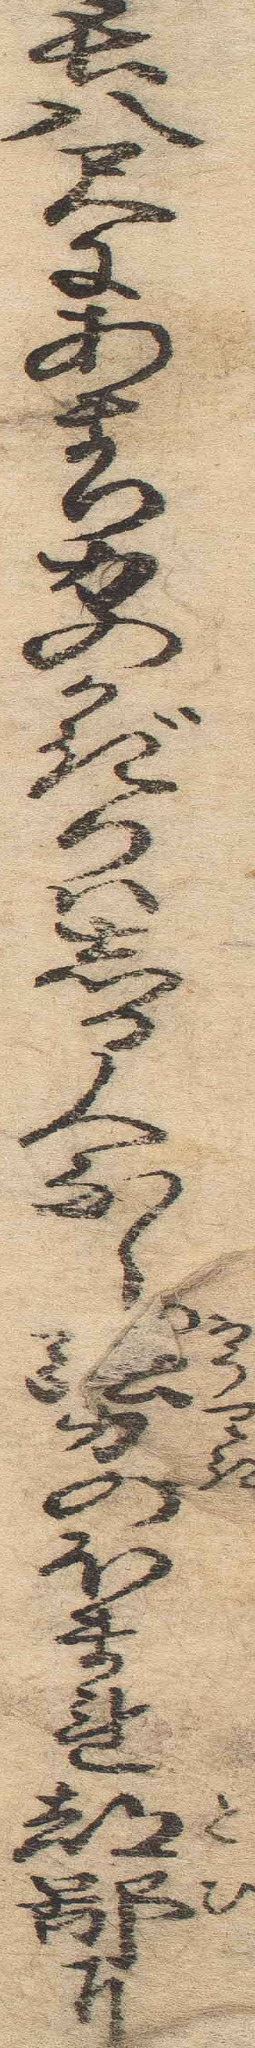長八尺にあまり力のかぎりはしる人なし。強力のほまれ都鄙に
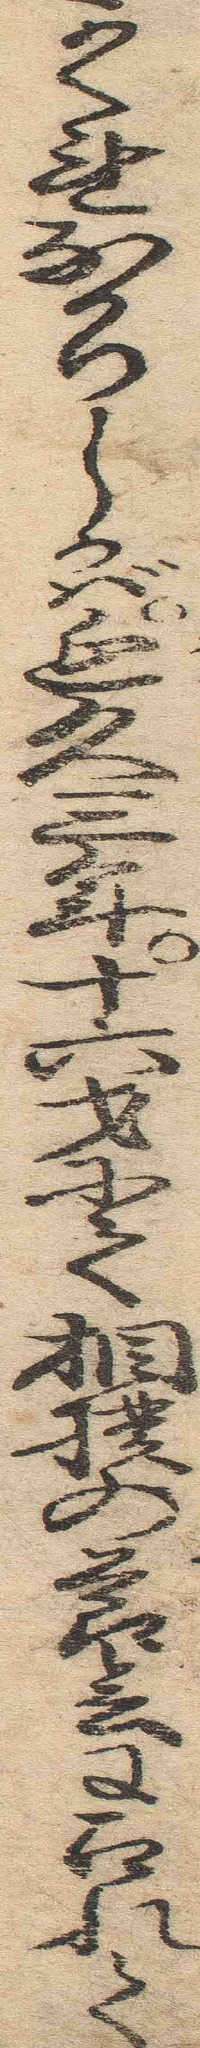かくれなかりしかば。延久三年。十六才にて相撲の節会に召れて
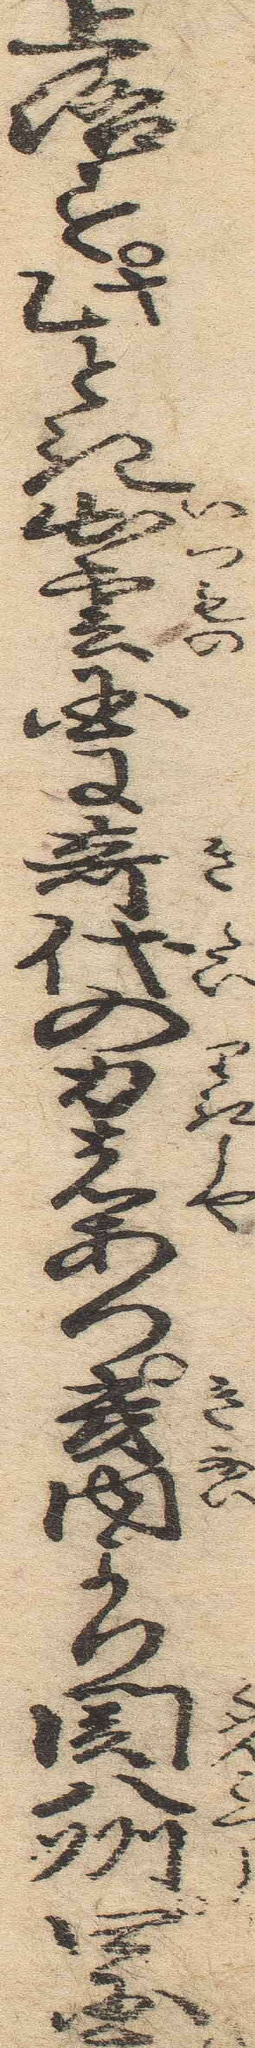上洛す。此とき出雲国に希代の力者あり。畿内より関八州四国
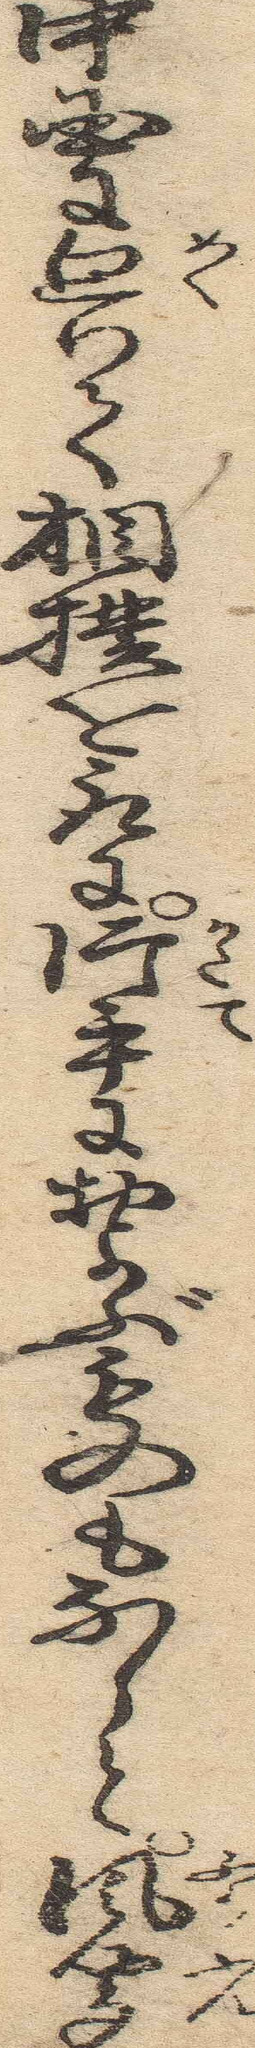中国に廻りて相撲を取に。片手におよぶものなしと。風聞
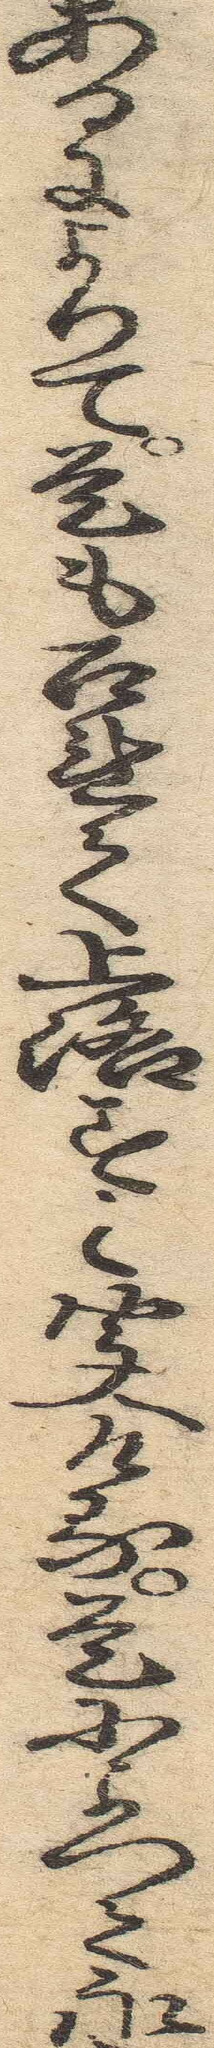あるによりて。是も召れて上洛すへく聞へける。是によつて永
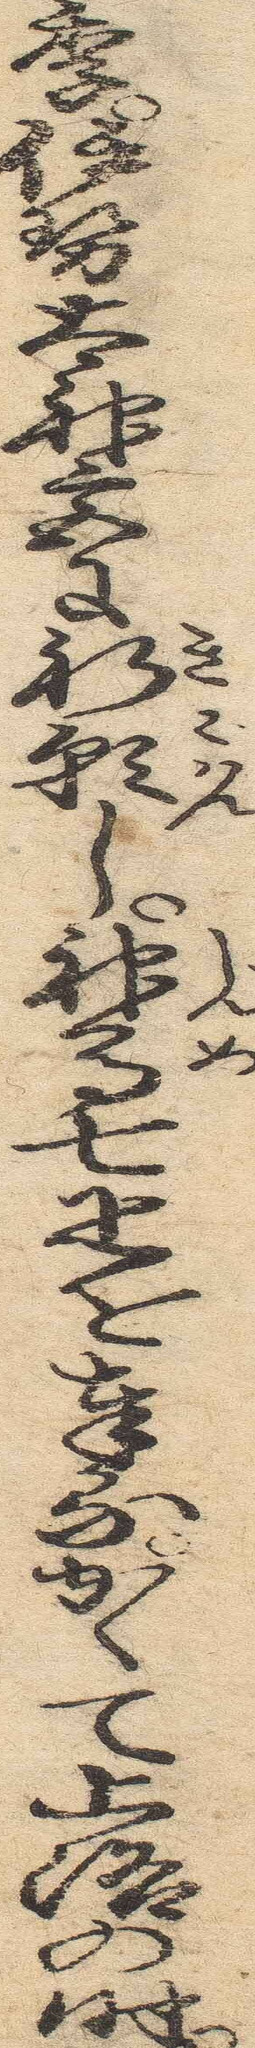季伊勢大神宮に祈願し。神馬七疋を奉る。かくて上洛の時
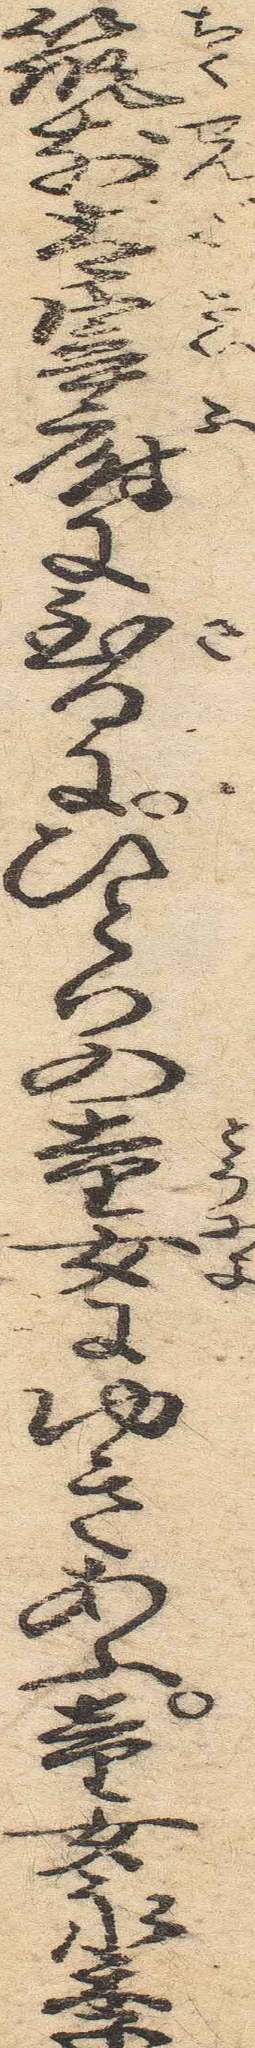筑前太宰府に至るに。ひとりの童女にゆきあふ。童女永季
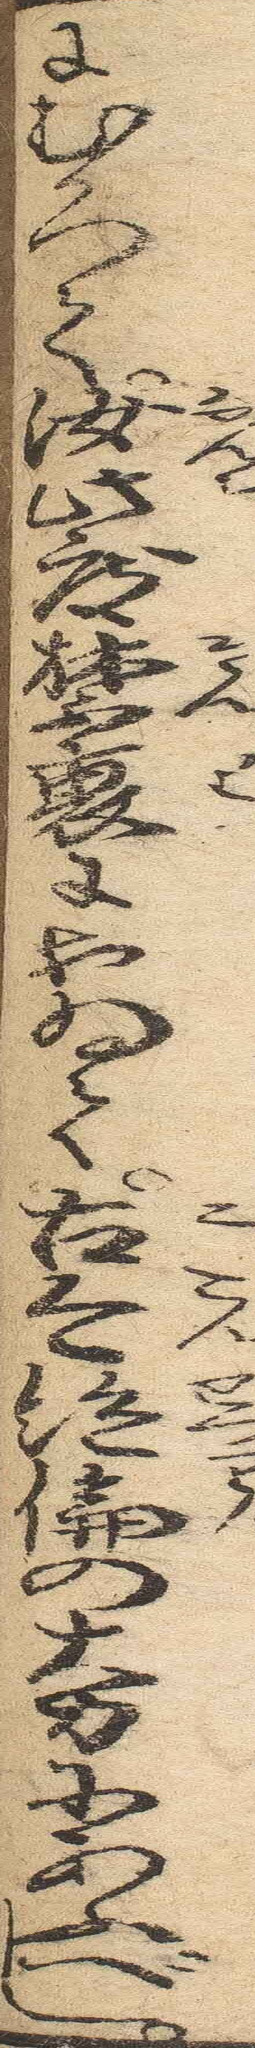にむかつて汝此度禁裏におゐて。古今絶倫の大力にあふべし。
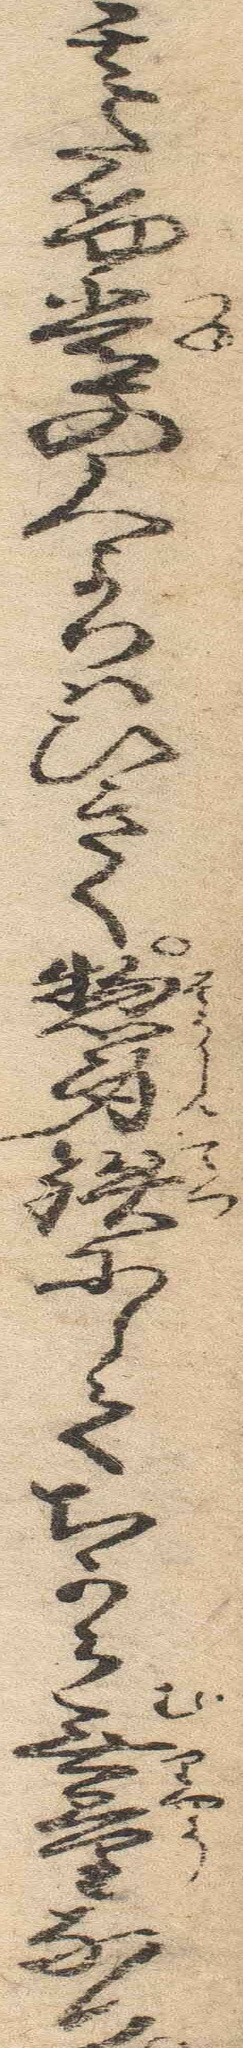其たけ常の人よりはひきく。惣身鉄にしてちから無量なり。
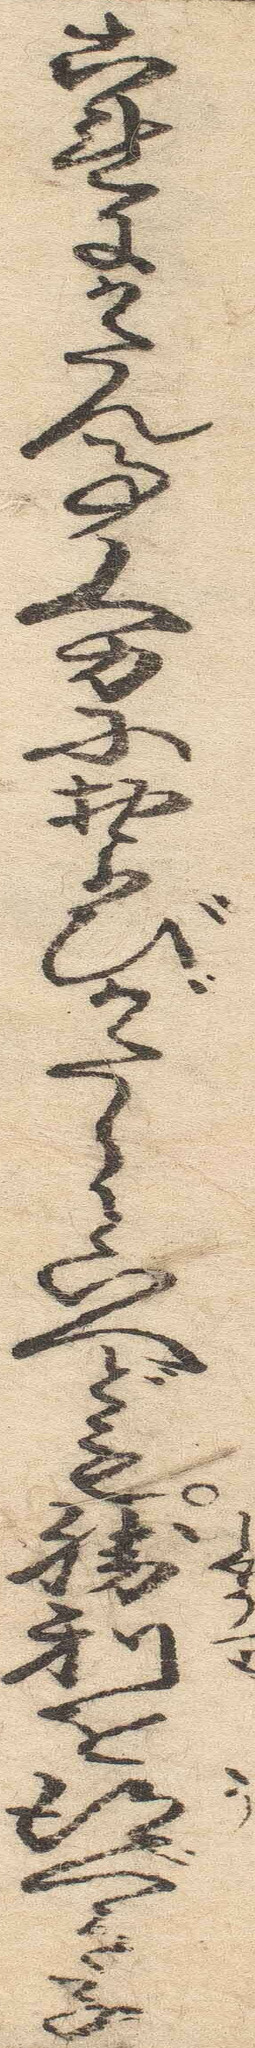これにかたん事人力におよびかたしといへども。勝利を得へる子
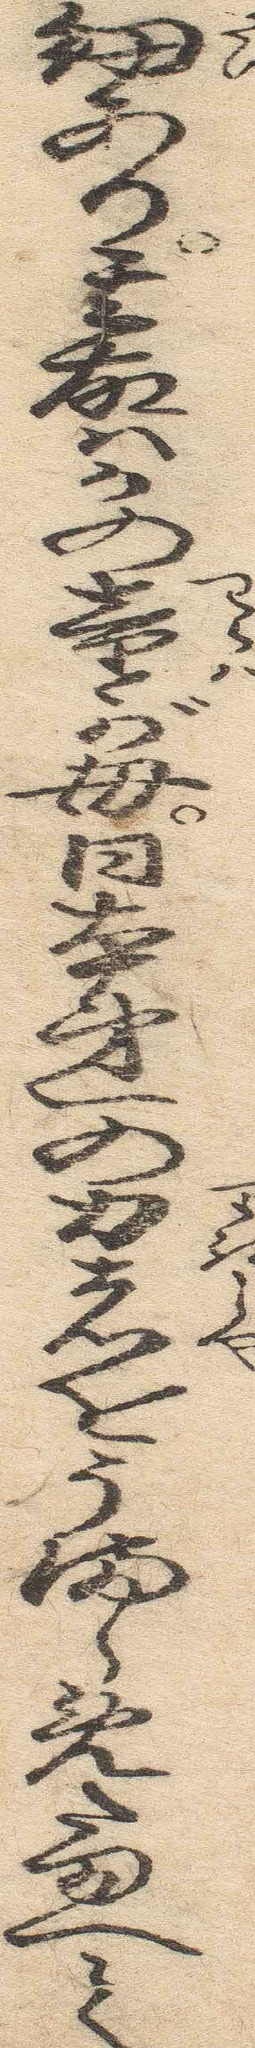細あり。其故はかの童が母。日本第一の力者をうましめたまへと
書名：古今相撲大全
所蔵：東京学芸大学附属図書館 国文学研究資料館
